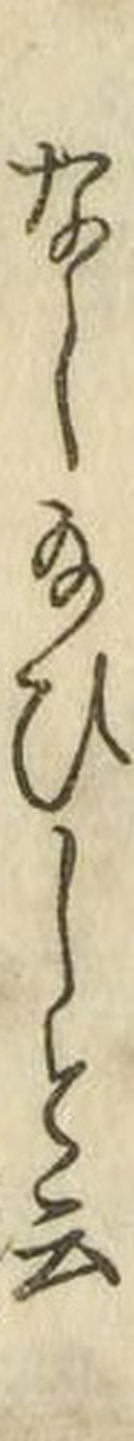なし給ひしと云
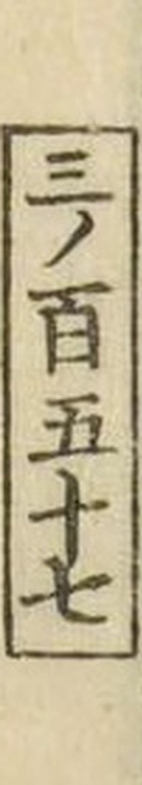三ノ百五十七
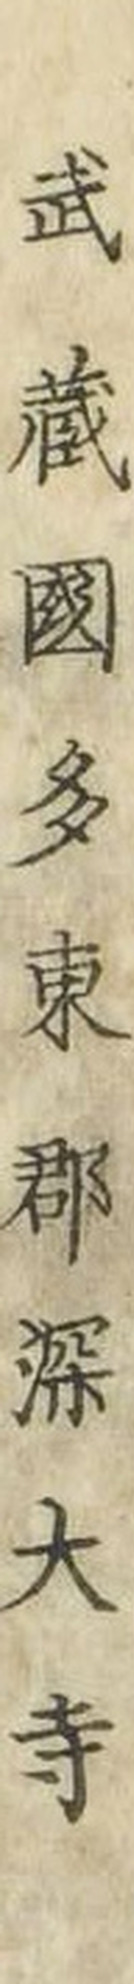武蔵国多東郡深大寺
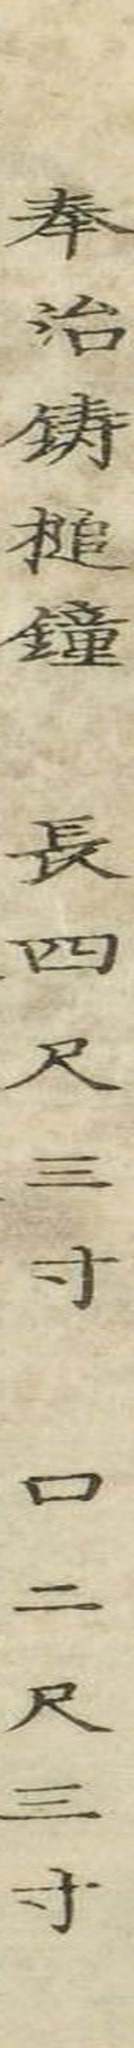奉治鋳槌鐘長四尺三寸口二尺三寸
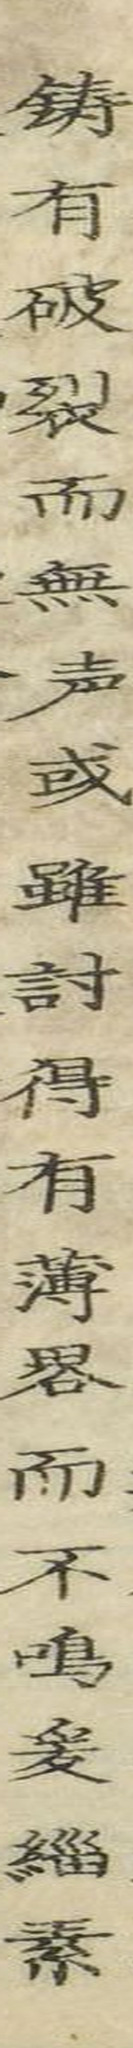鋳有破裂而無声或雖討得有薄畧而不鳴爰緇素
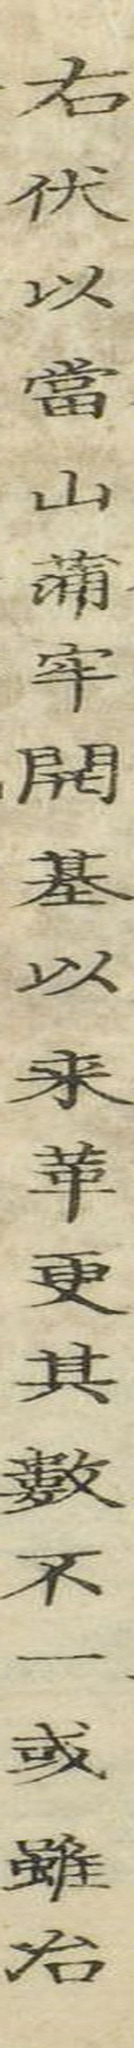右伏以当山蒲牢開基以来革更其数不一或雖冶
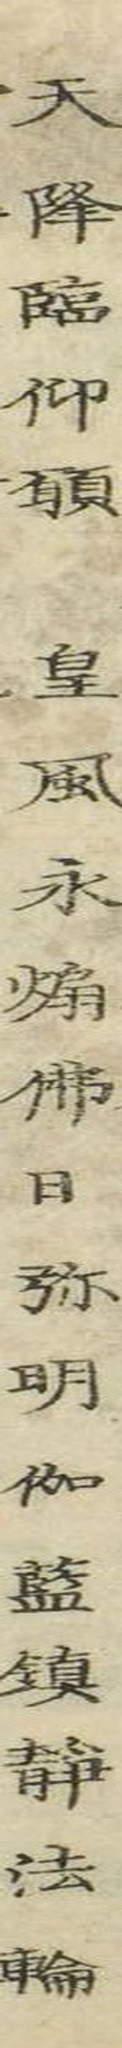天降臨仰顛皇風永煽佛日弥明伽藍鎮静法輪
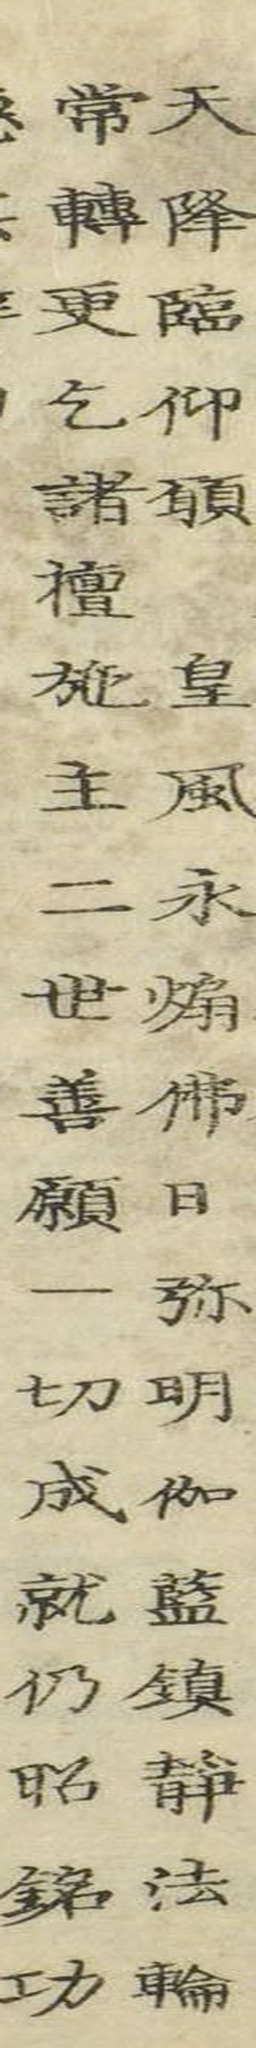常転更乞諸檀施主二世善願一切成就仍昭銘功
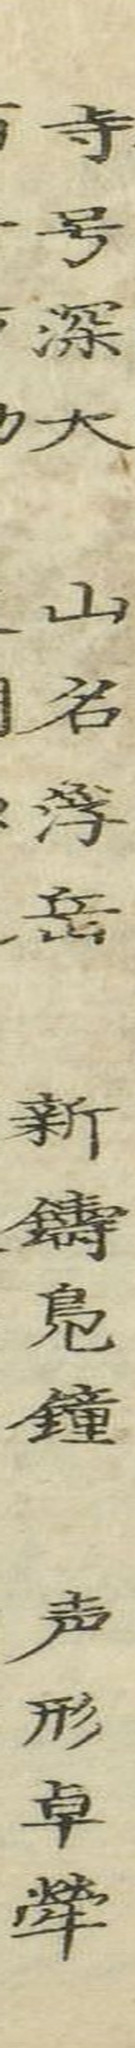寺号深大山名浮岳新鋳鳬鐘声形卓犖
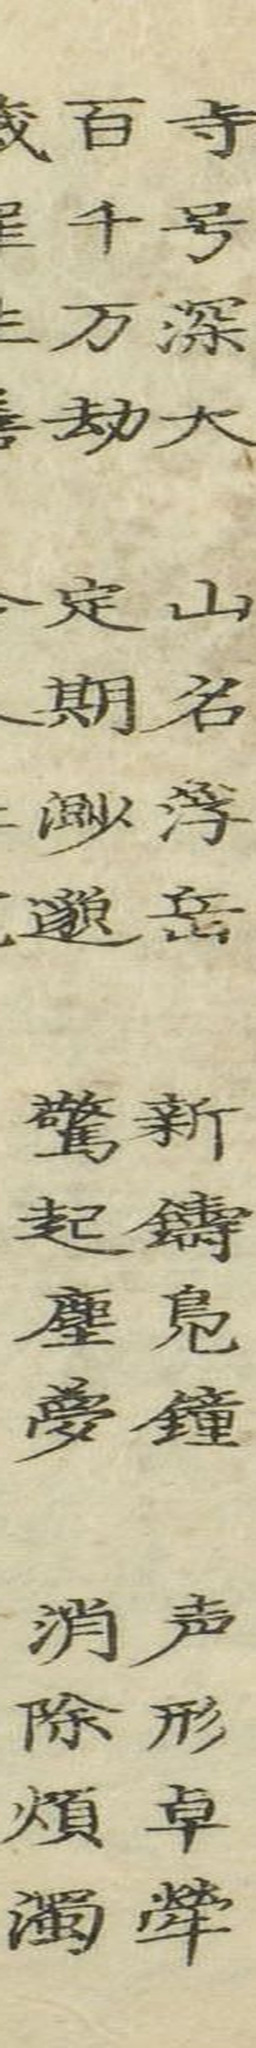百千万劫定期渺邈驚起塵夢消除煩濁
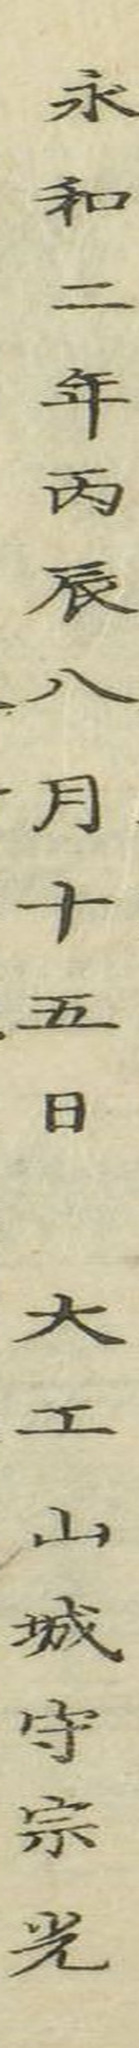永和二年丙辰八月十五日大工山城守宗光
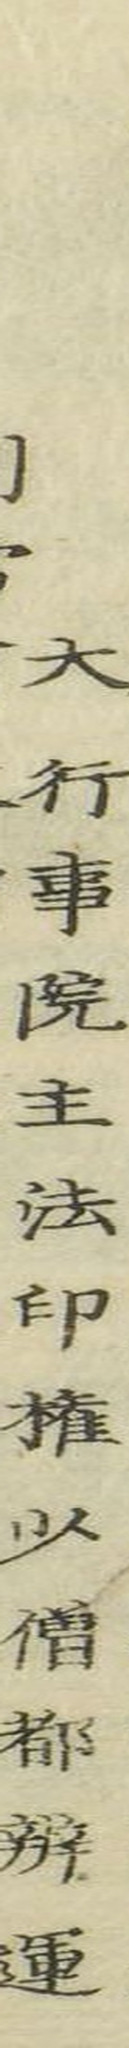大行事院主法印権少僧都辨運
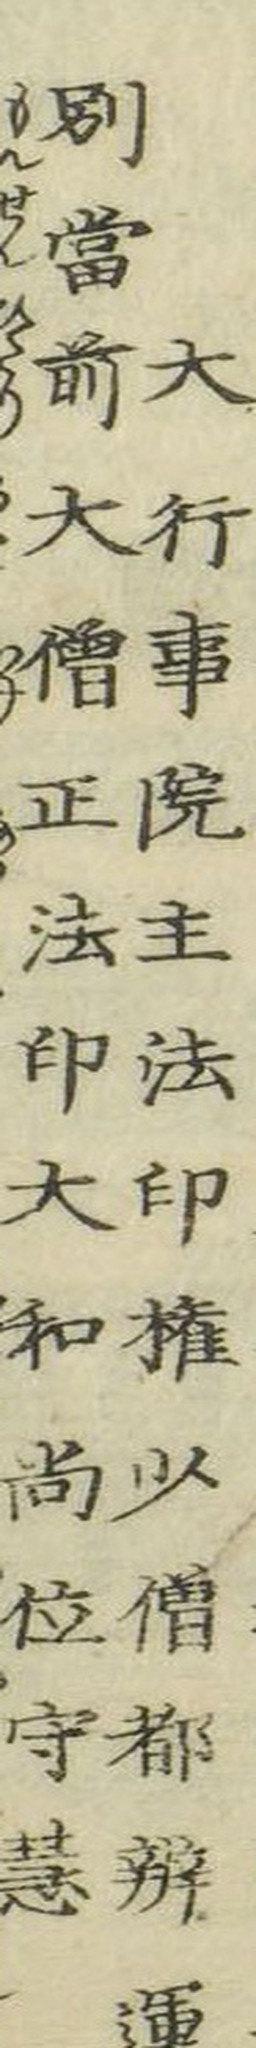別当前大僧正法印大和尚位守慧
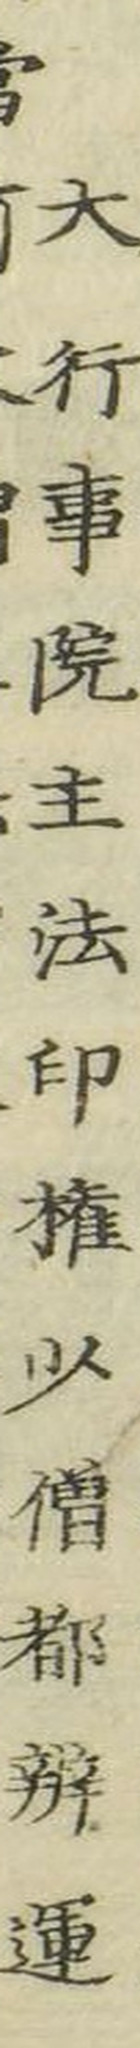大行事院主法印権少僧都辨運

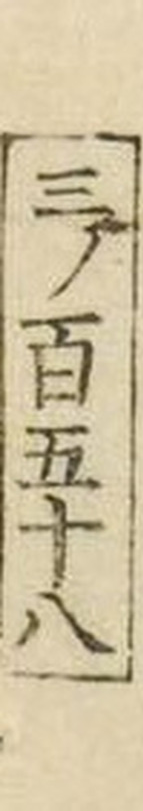三ノ百五十八

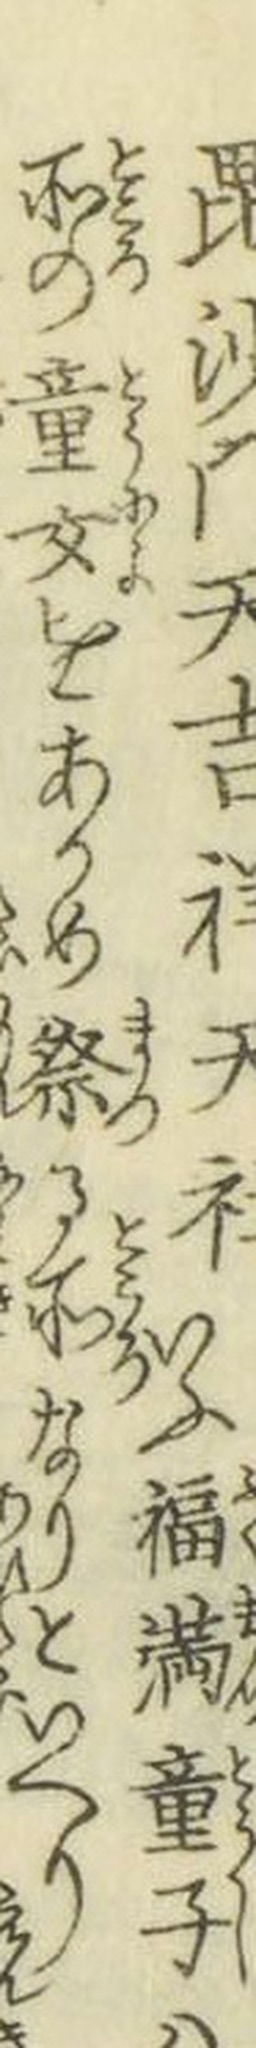所の童女をあかめ祭る所なりといへり
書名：江戸名所図会 20巻 巻之9
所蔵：東京学芸大学教育コンテンツアーカイブ
